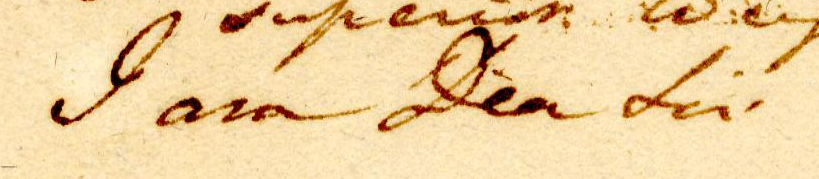I am Dear Sir
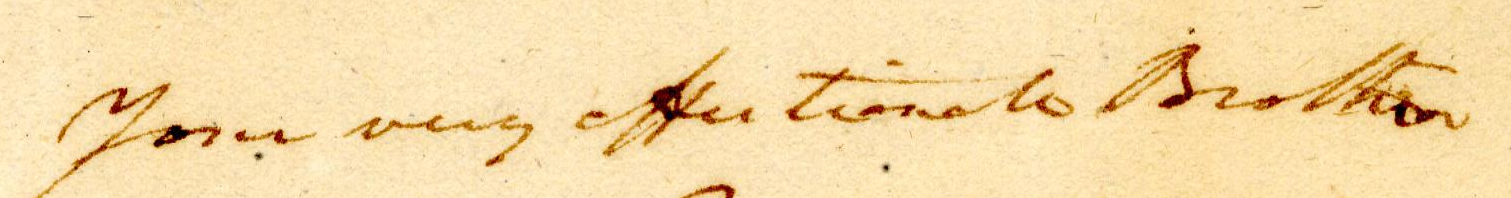your very affectionate Brother
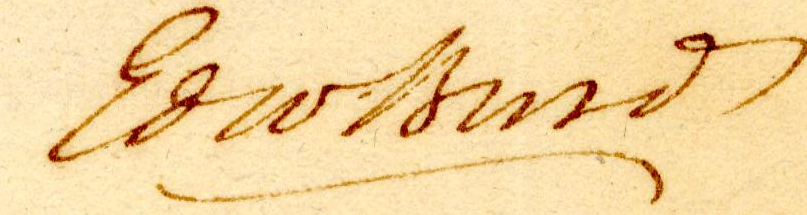Edw.Burd
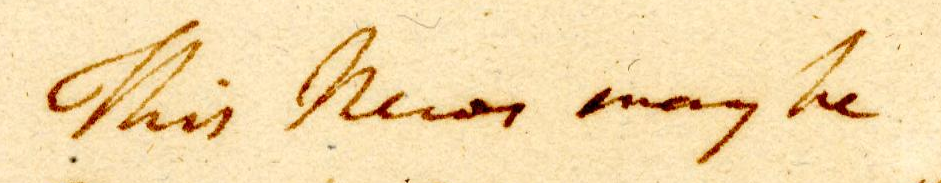This News may be
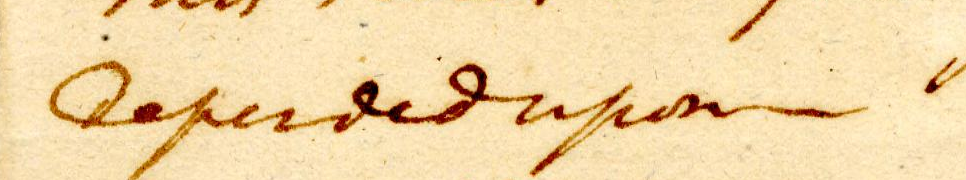Depended upon
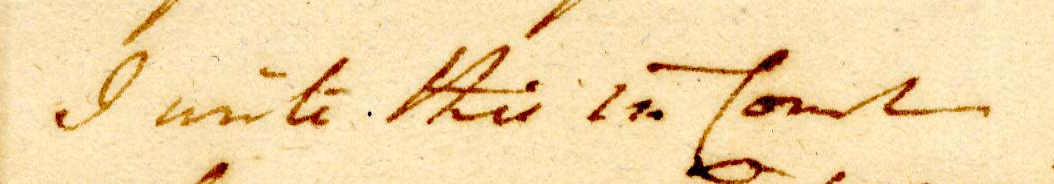I write this in Court
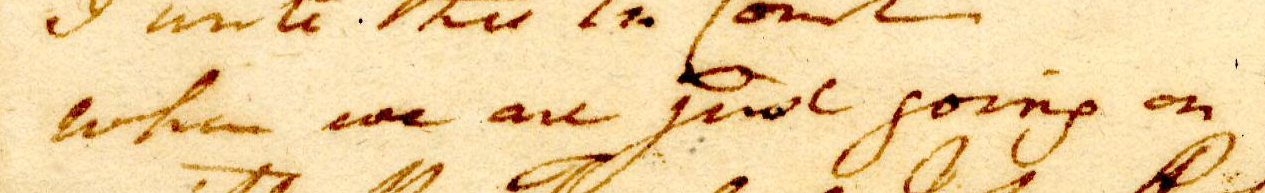where we are just going on
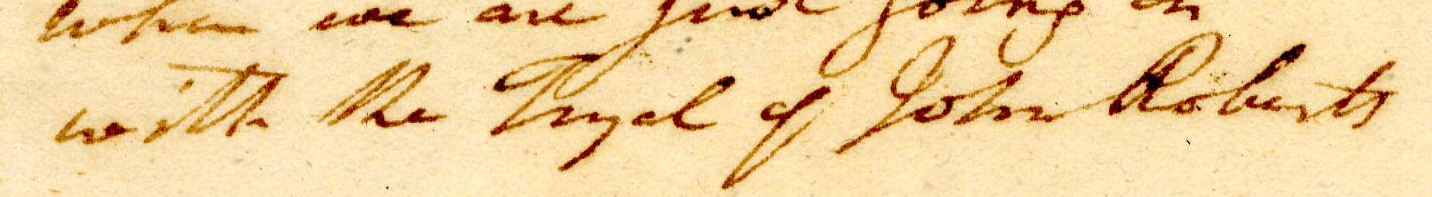with the Tryal of John Roberts
